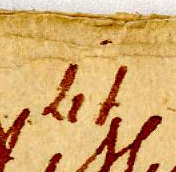41
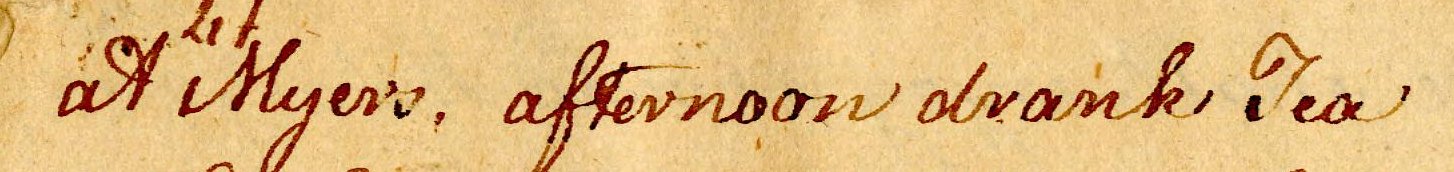at Myers, afternoon drank Tea
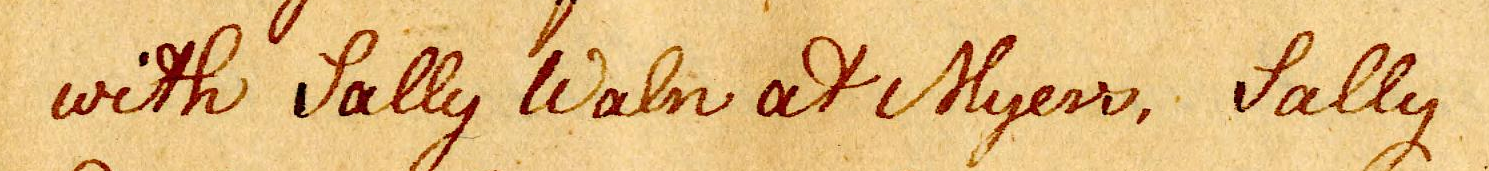with Sally Waln at Myers, Sally
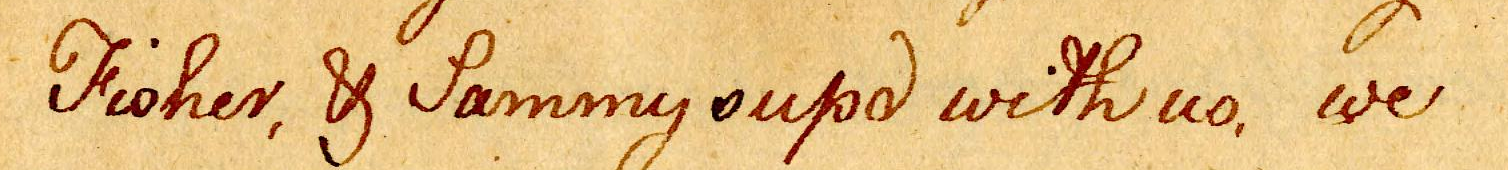Fisher, & Sammy supd with us, we
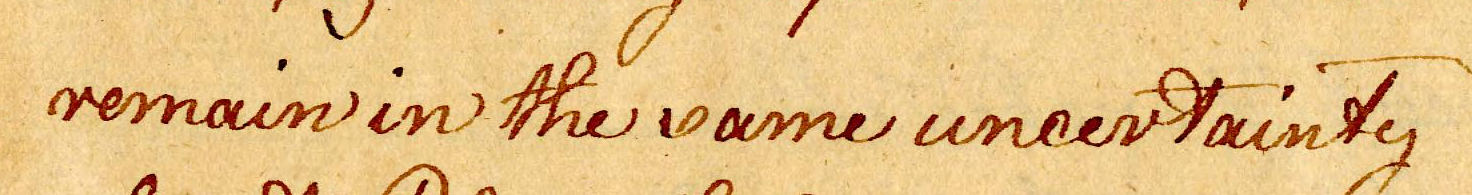remain in the same uncertainty
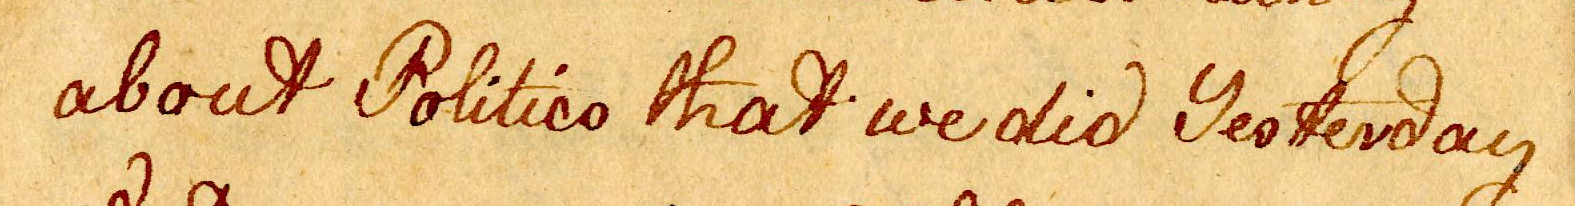about Politics that we did Yesterday
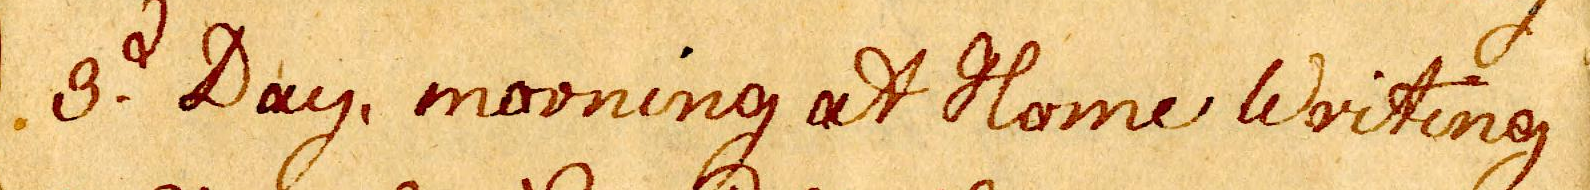3^d Day, morning at Home Writing
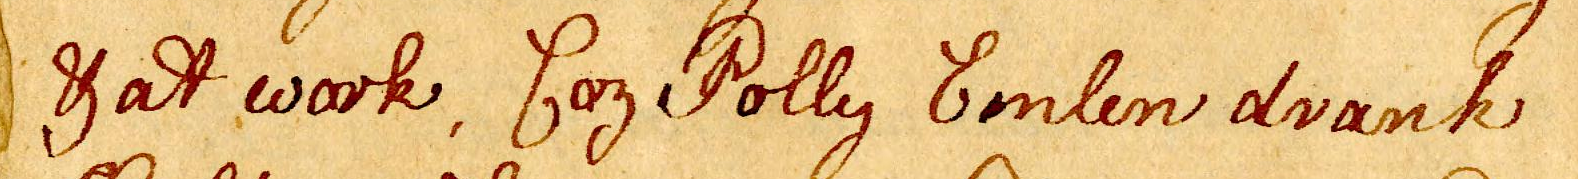& at work, Coz Polly Emlen drank
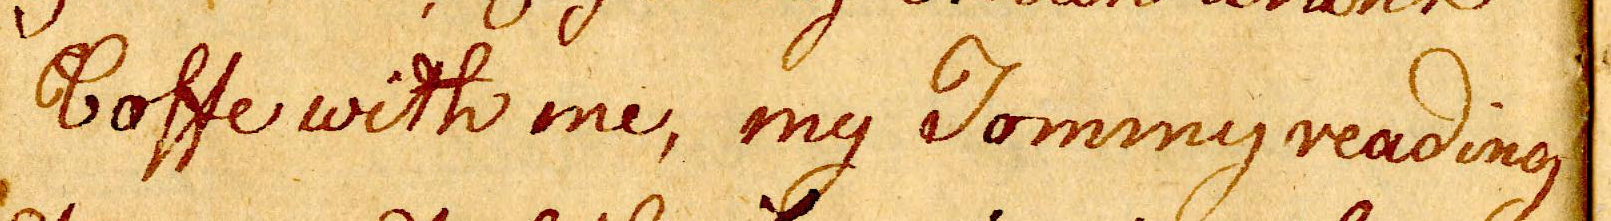Coffe with me, my Tommy reading
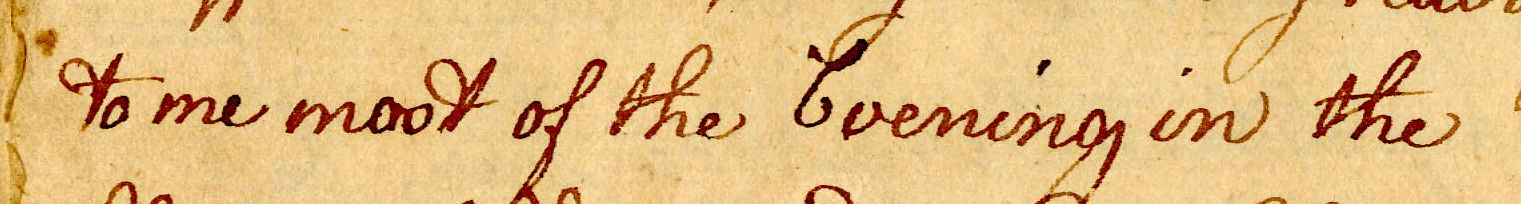to me most of the Evening in the
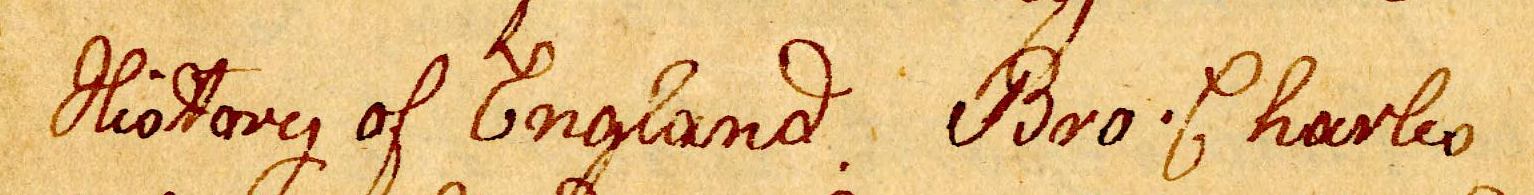History of England. Bro Charles
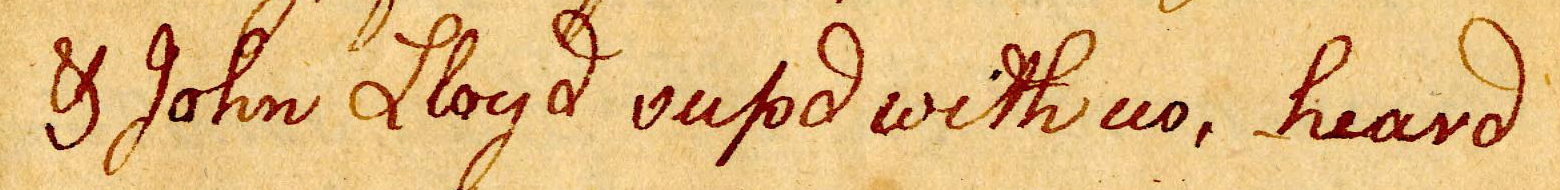& John Lloyd sup'd with us, heard
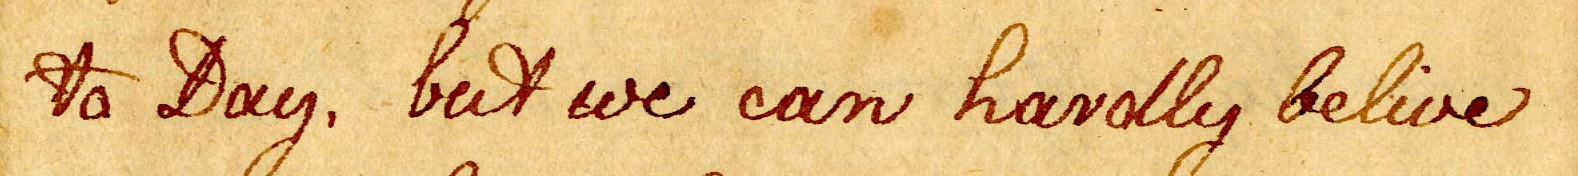to Day, but we can hardly belive
